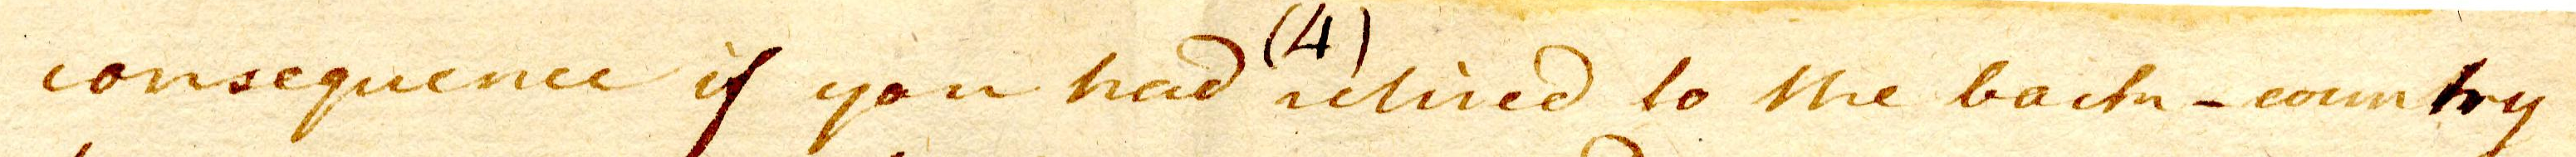consequence if you had retired to the back- country
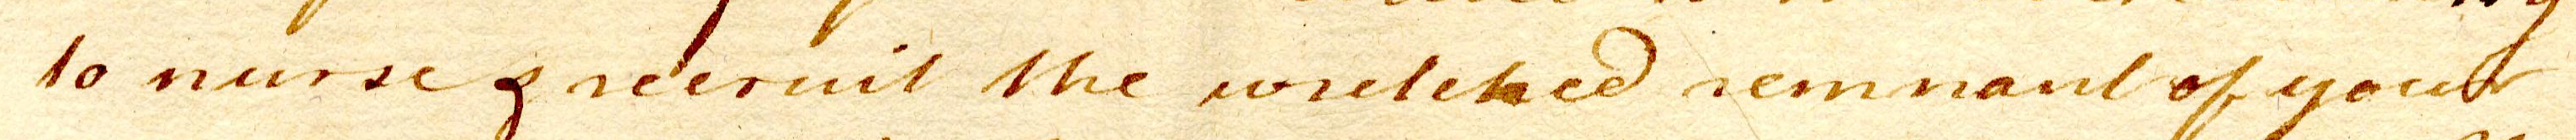to nurse & recruit the wretched remnant of your
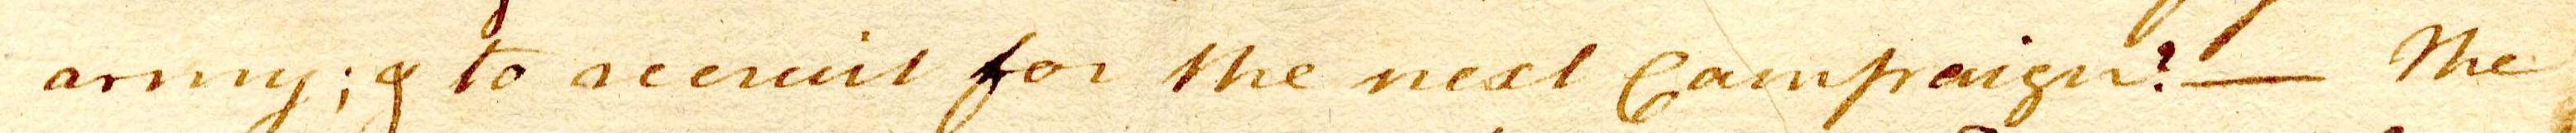army; & to recruit for the next Campaign?- The
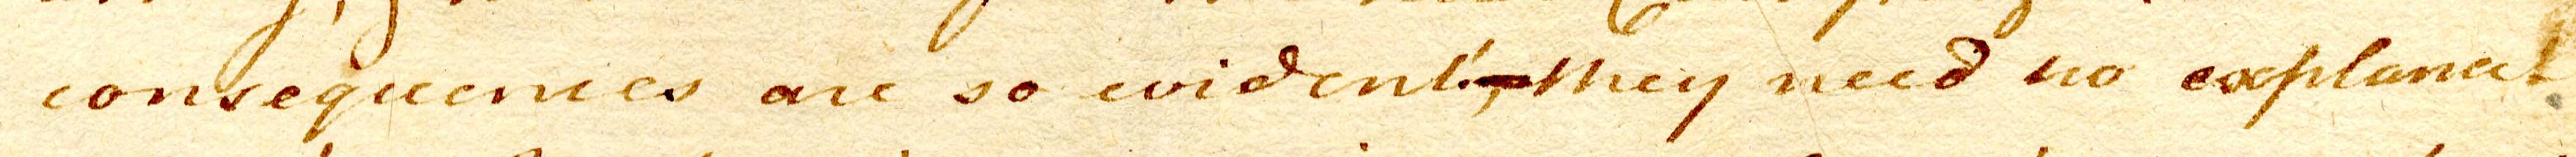consequences are so evident, they need no explanat
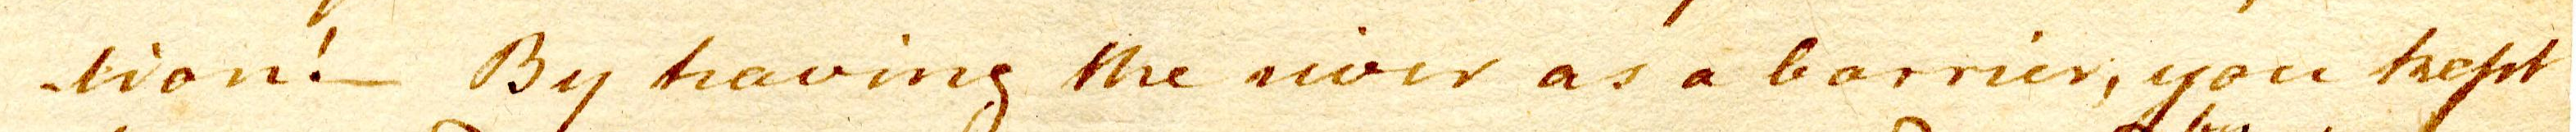-tion!- By having the river as a barrier, you kept
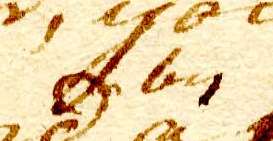by
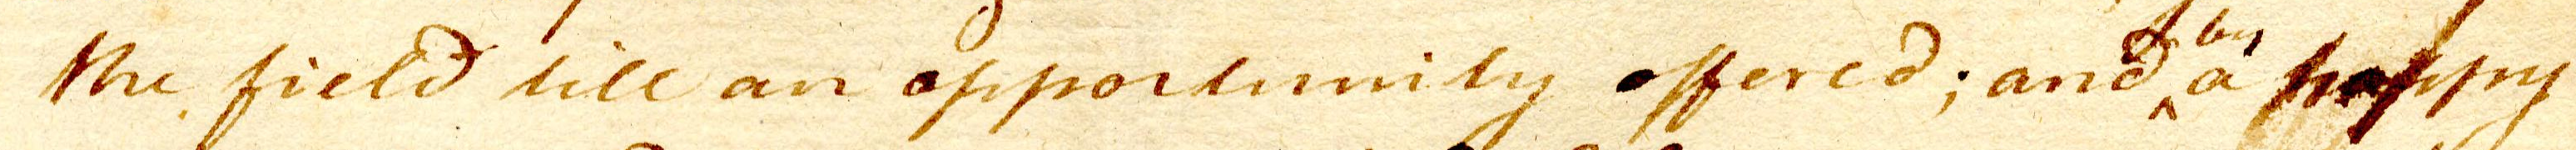the field till an opportunity offered; and ^ a happy
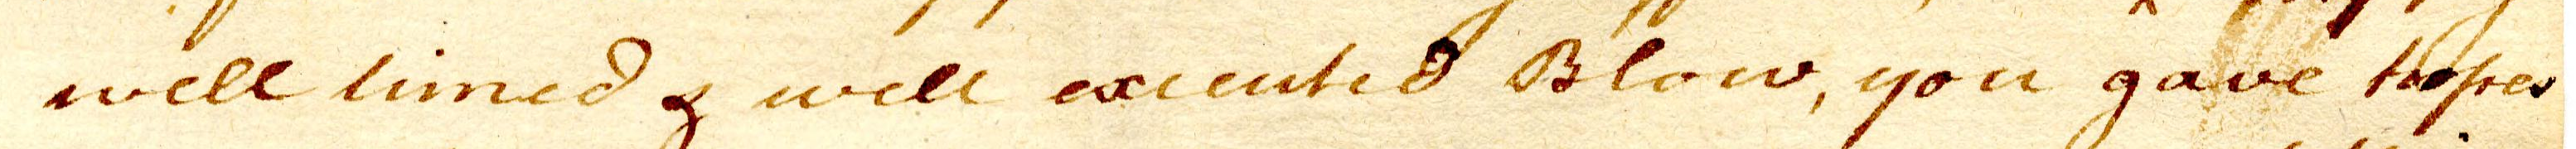well timed & well executed Blow, you gave hopes
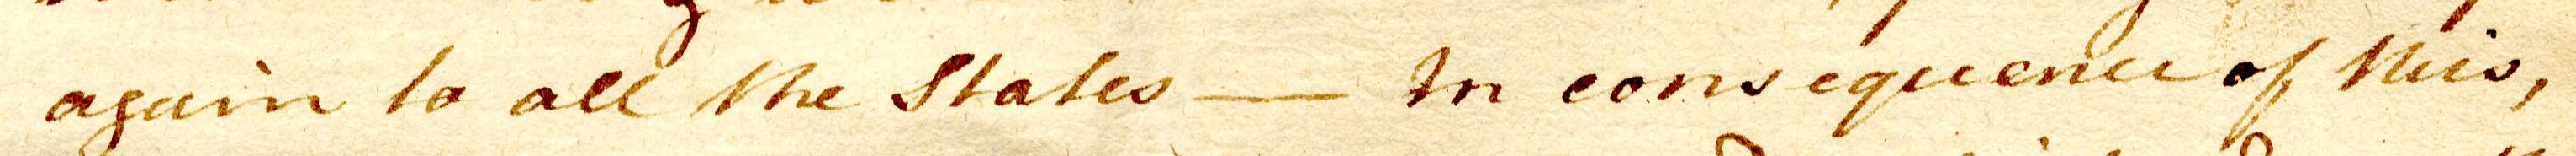again to all the States- In consequence of this,
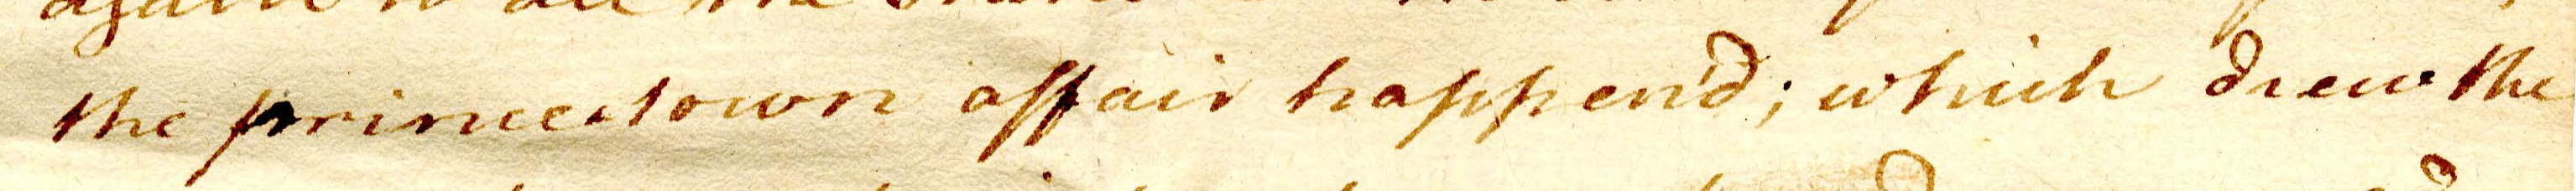the princetown affair happen'd; which drew the
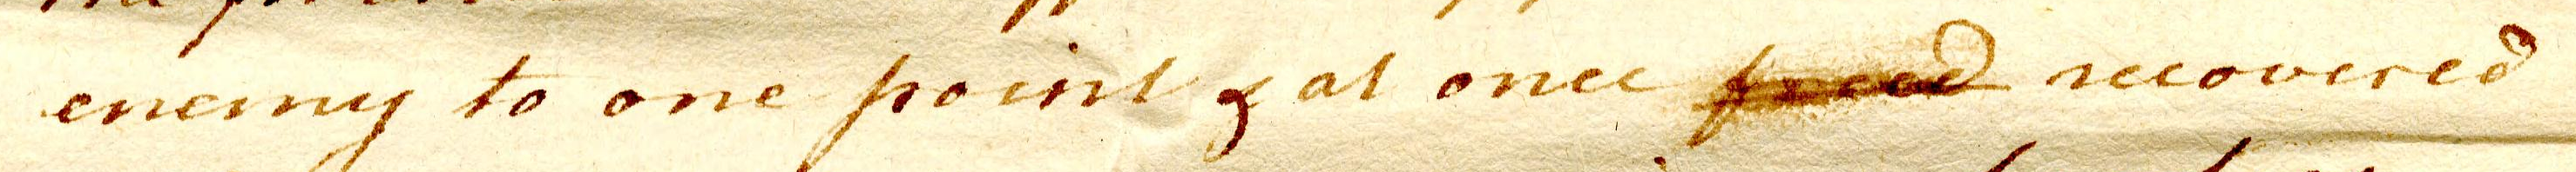enemy to one point & at once [freed] recovered
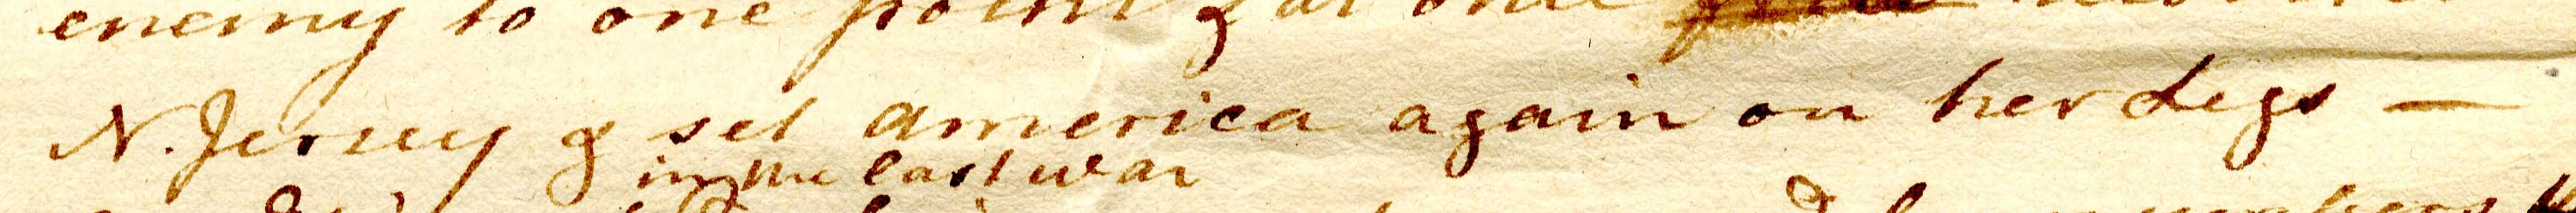N. Jersey & set America again on her Legs-
